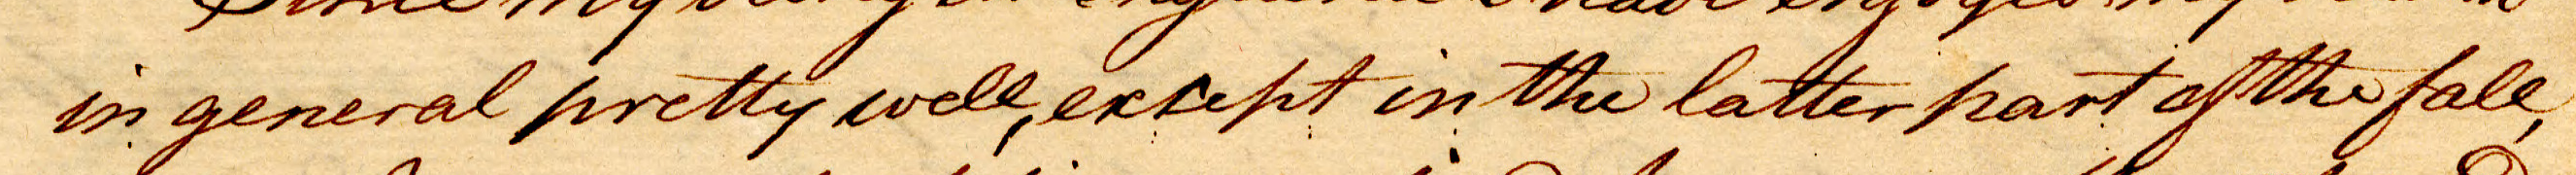in general pretty well, except in the latter part of the fall,
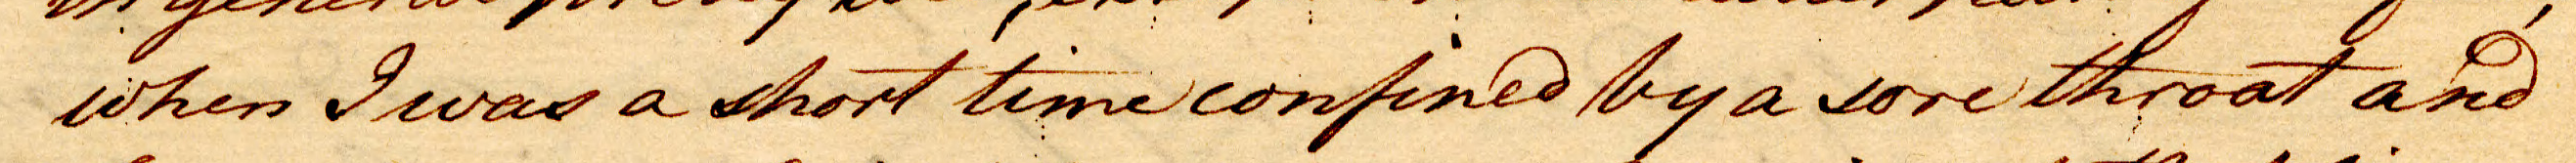when I was a short time confined by a sore throat and
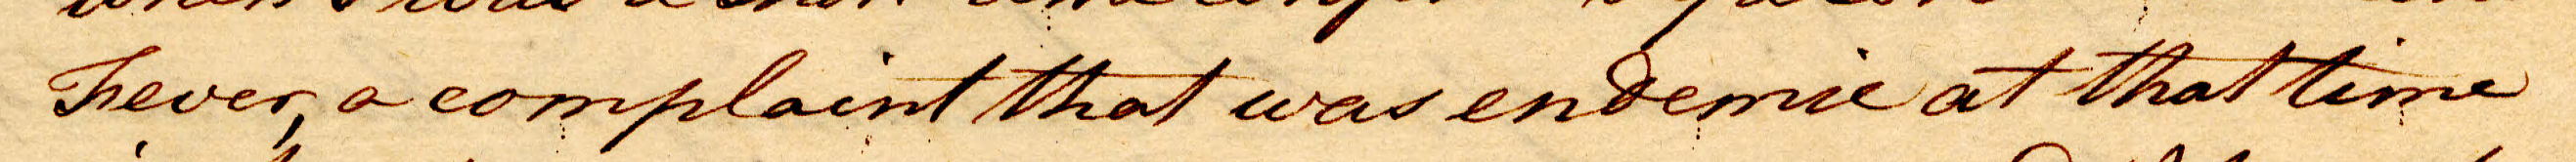Fever, a complaint that was endemic at that time
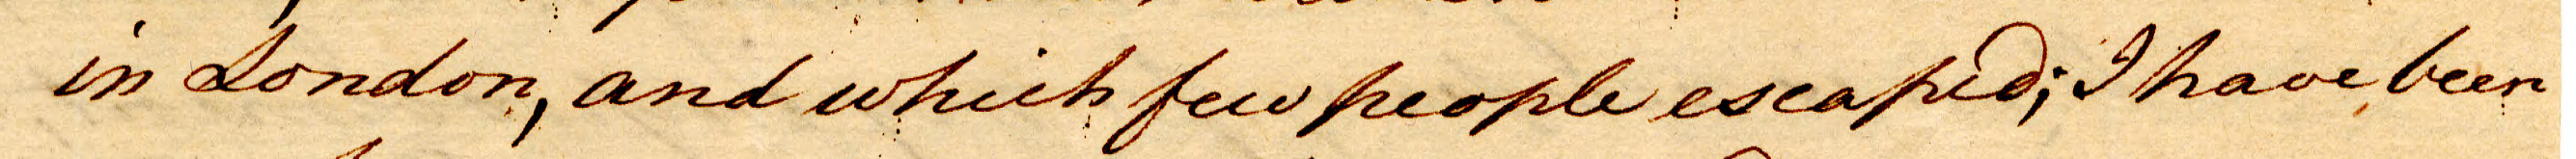in London, and which few people escaped; I have been
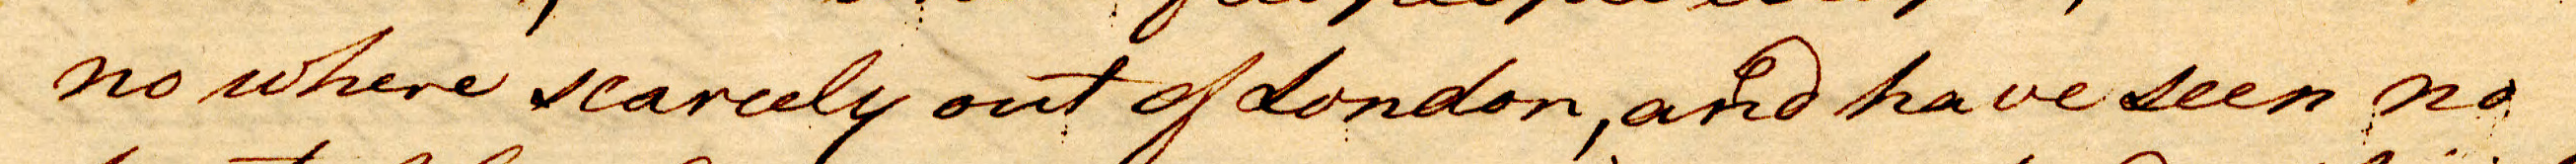no where scarcely out of London, and have seen no
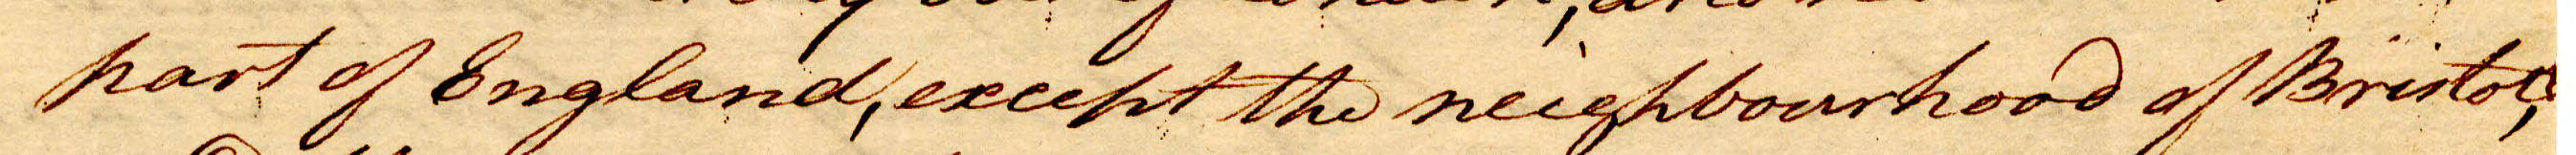part of England, except the neighbourhood of Bristol;
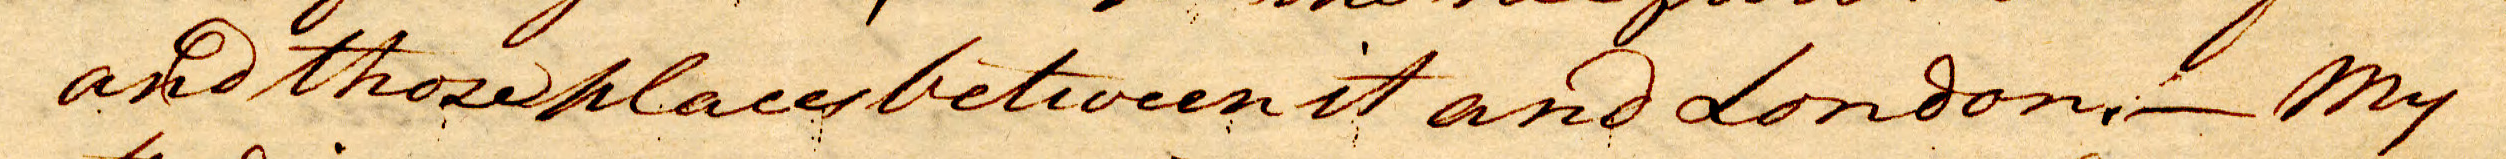and those places between it and London.- My
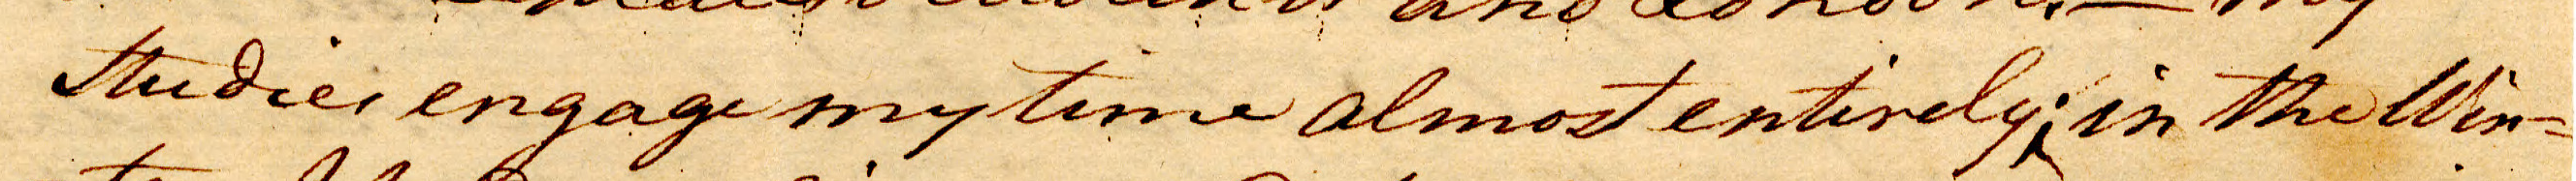studies engage my time almost entirely; in the Win-
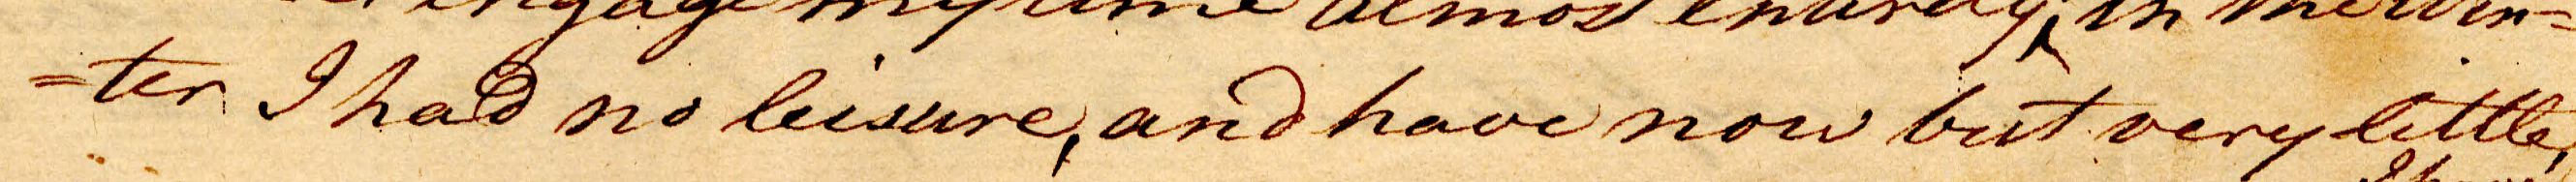-ter I had no leisure, and have now but very little,
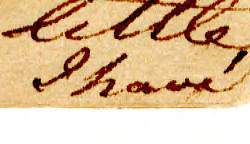I have
